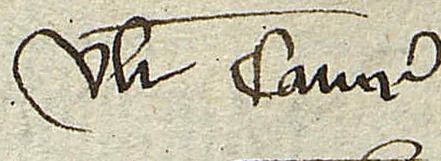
Vlr* Conr*
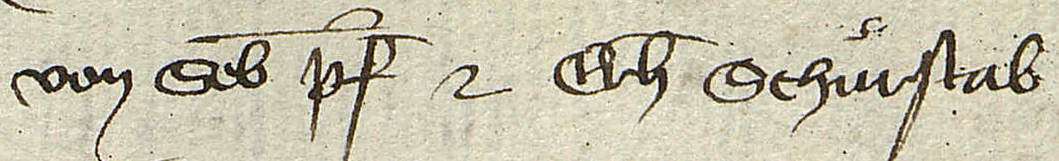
von Seb* pf* @ Erh* Schürſtab
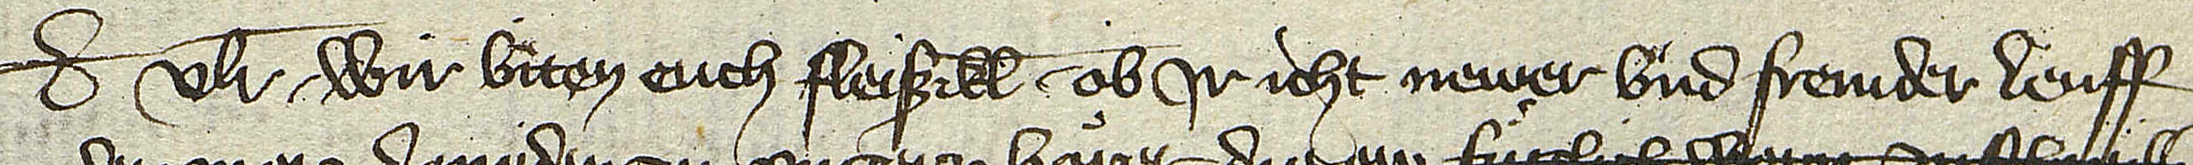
L* vlr* / Wir biten euch fleiſʒikl* / ob Ir icht newer vnd fremder leuff
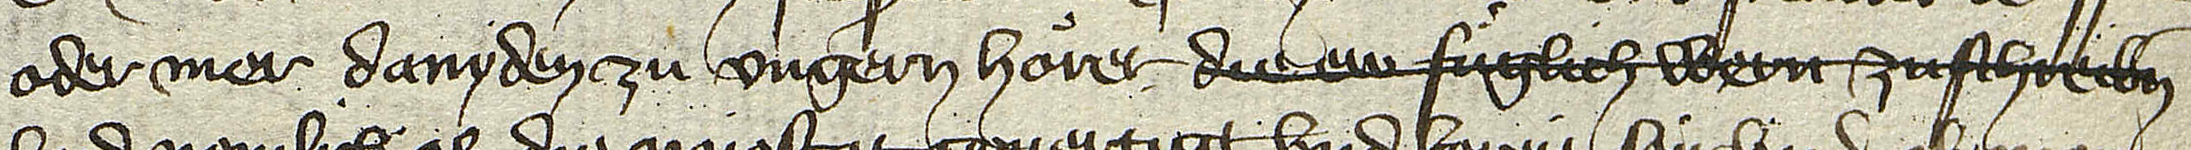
oder mer danyden cʒu vngern höret die ew füglich wern cʒuſchreibn*
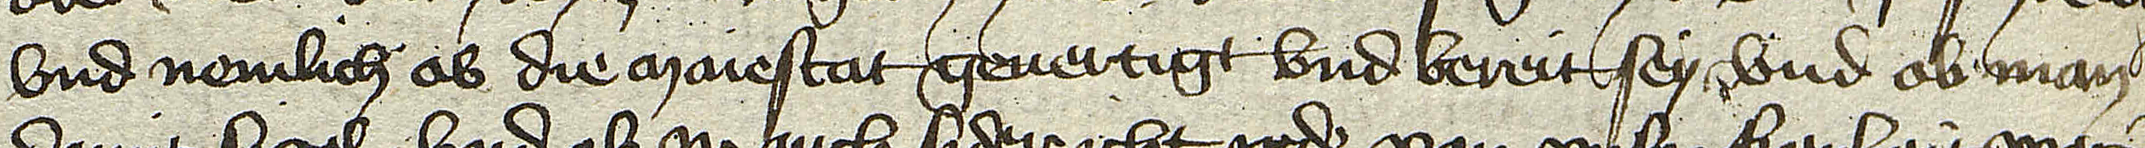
vnd nemlich ob die Maieſtat geuertigt vnd bereit ſey / vnd ob man
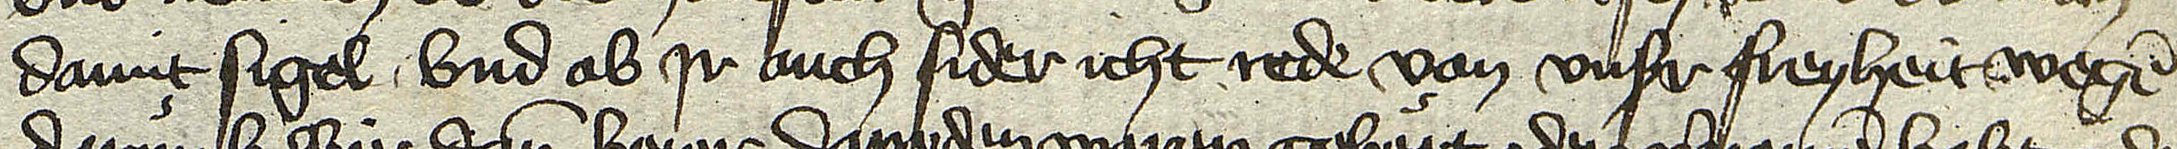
damit ſigel vnd ob Ir auch ſider icht rede von vnſ*r freyheit wege*
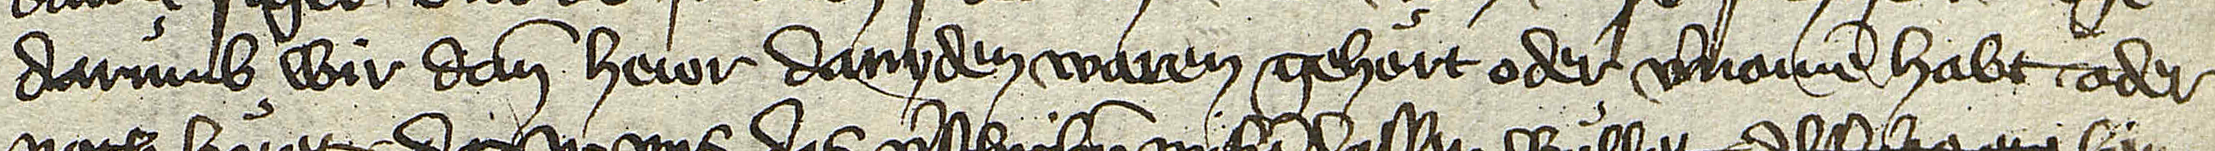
darümb wir dan* hewr* danyden waren gehört oder v*nome* habt / oder
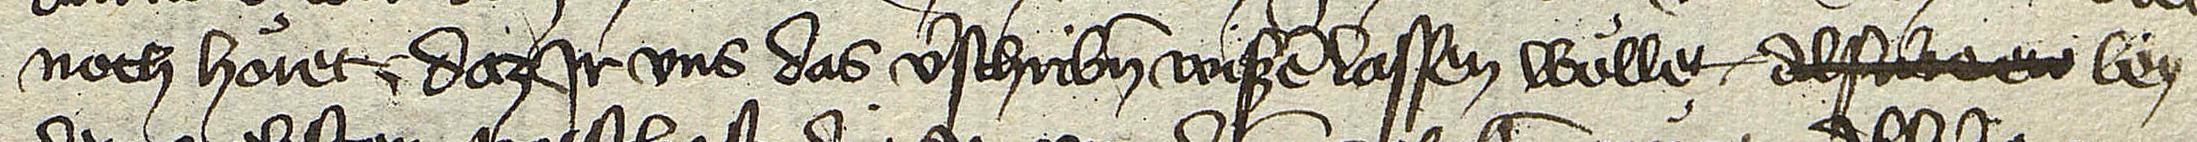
noch höret / daʒ Ir vns das v*ſchribn* wiſʒe* laſſen wöllet / Alſu*re ew bey
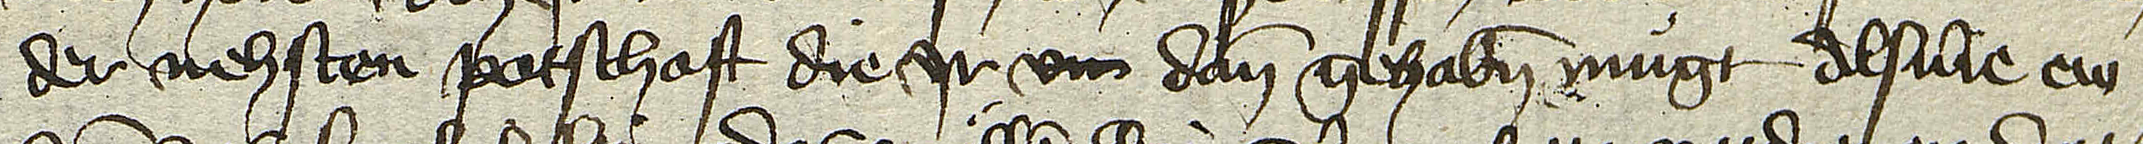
der nehſten potſchaft die Ir vm dan* gehabn* mügt Alſu*re ew
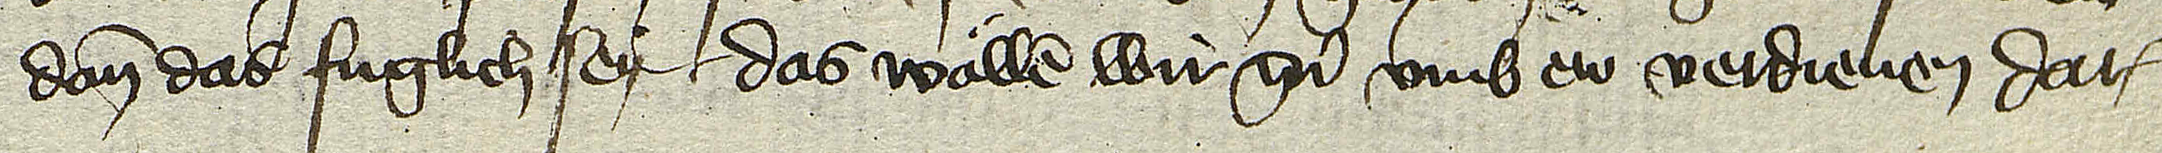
dan* das fuglich ſey / das wölle* wir gn* vmb ew verdienen dat*
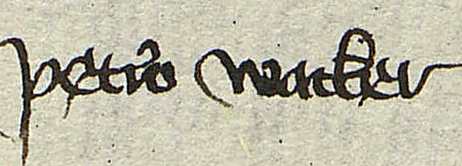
Petro wacker
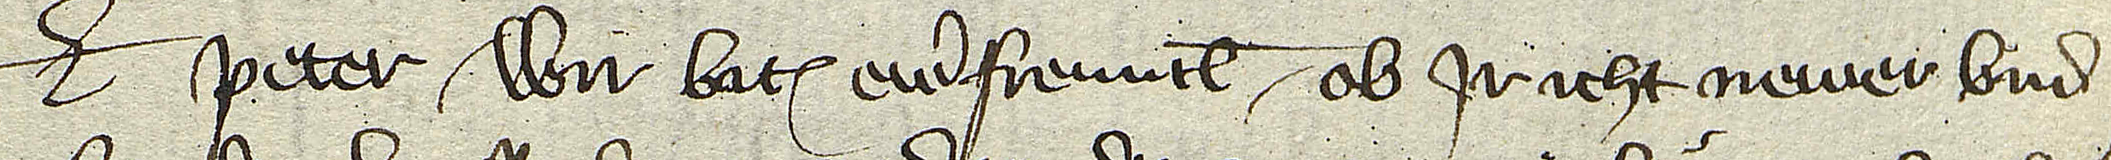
L* Peter / wir bit* ew* freuntl* / ob Ir icht newer vnd
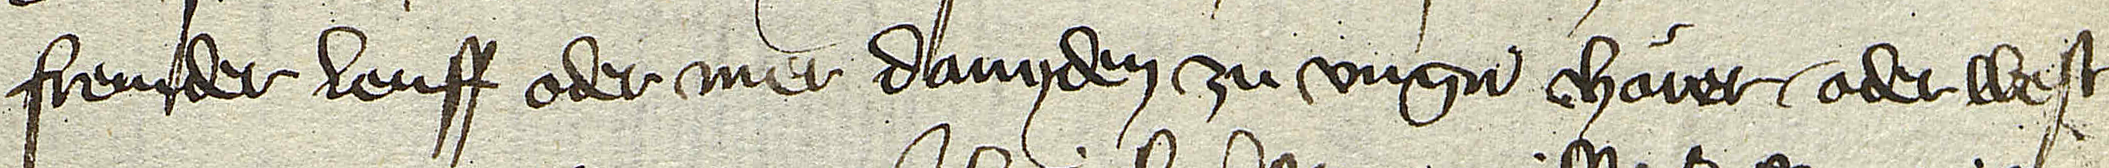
fremder leuff oder mer danyden cʒu vngn* höret / oder weſt
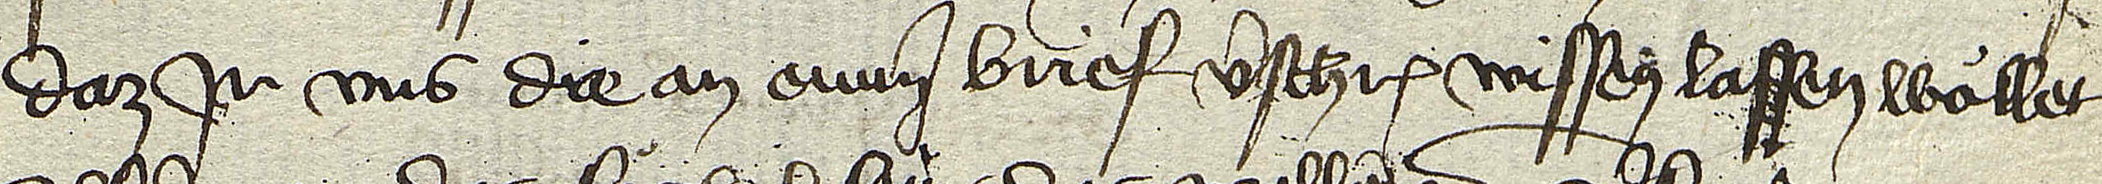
daʒ Ir vns die an ewm* brief v*ſchr* wiſſen laſſen wöllet
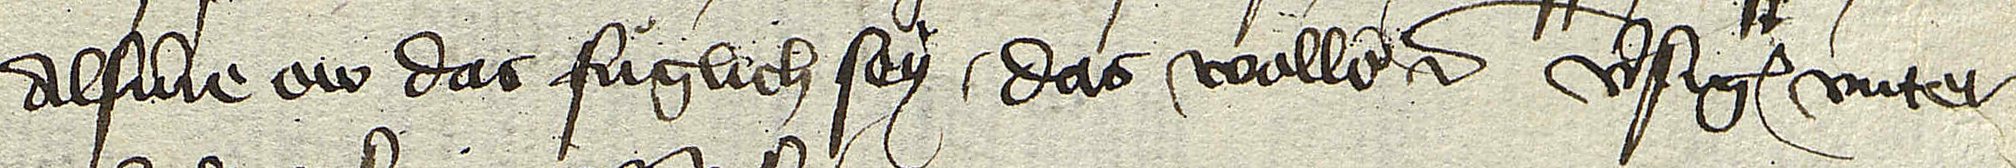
alſu*re ew das füglich ſey / das wölle* ec* v*ſig* vnter
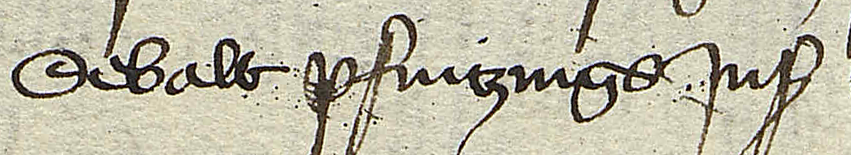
Sebalt Pfincʒings* Inſ*
